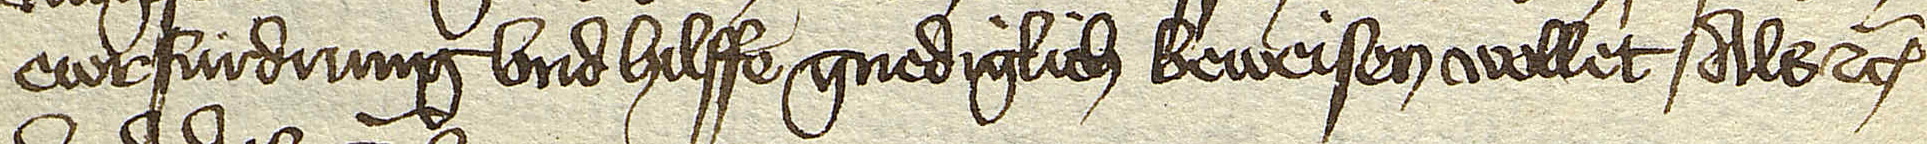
ewr fürdrung vnd hilffe gnediglich beweiſen wollet / Als ec*
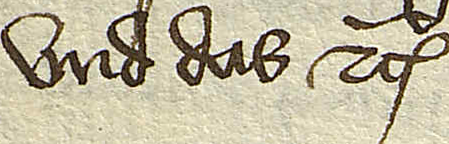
vnd das ec*
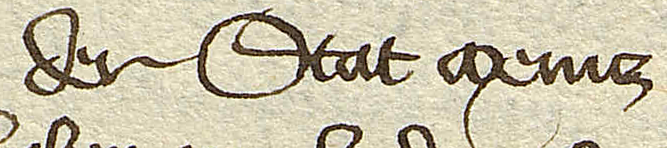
der Stat Meincʒ
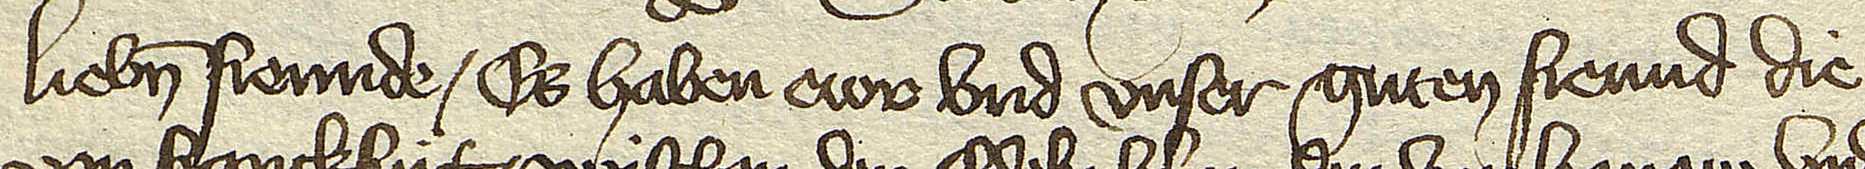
Liebn* freunde / Es haben ewr vnd vnſer guten freund die
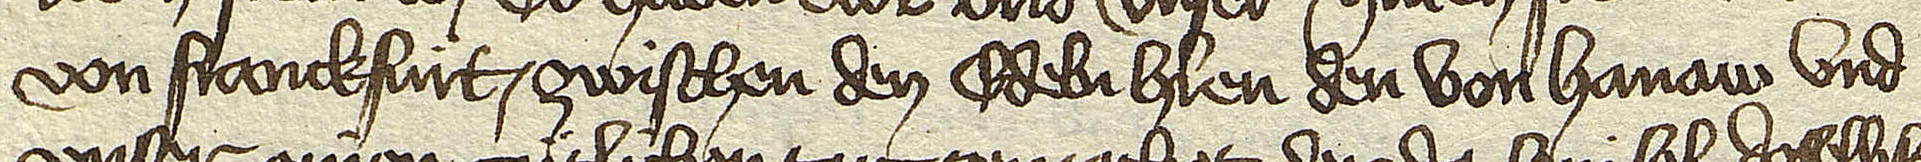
von franckfürt / cʒwiſchen den Edeln h*ren den von hanaw vnd
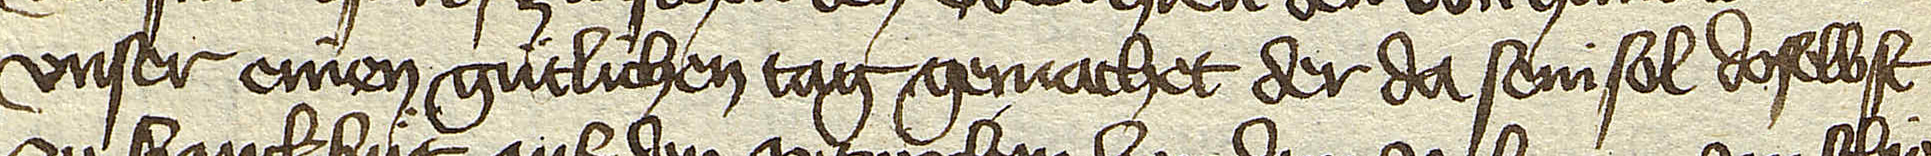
vnſer einen gütlichen tag gemachet der da ſein ſol doſelbſt
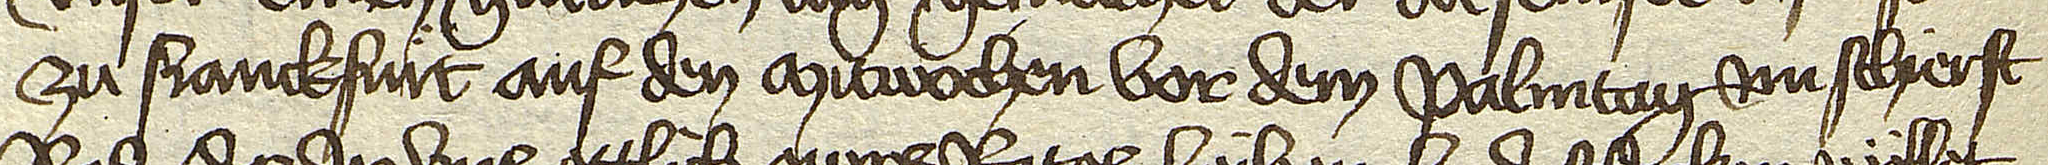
cʒu franckfürt auf den Mitwochen vor dem Palmtag nu ſchierſt
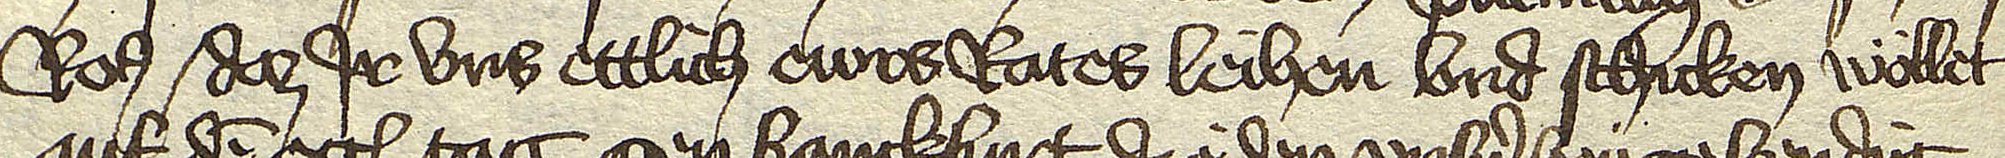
Ro* / daʒ Ir vns ettlich ewrs Rates leihen vnd ſchicken wöllet
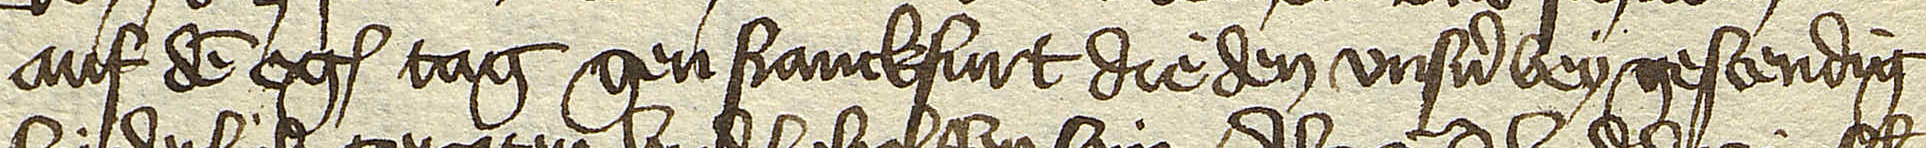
auf de* og* tag gen franckfurt die den vnſn* bey geſtendig
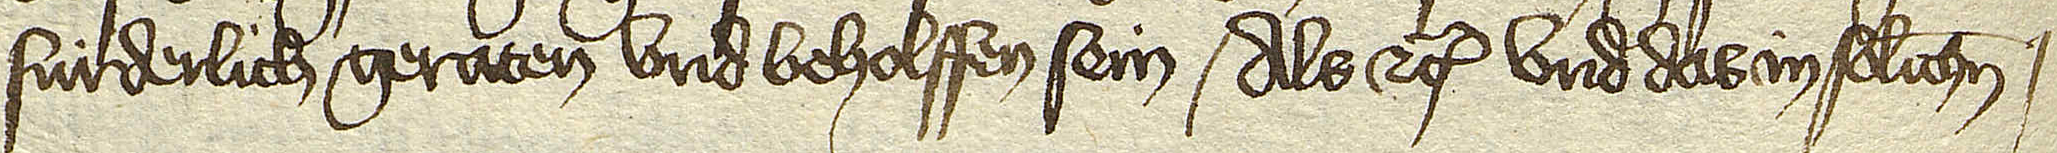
furderlich geraten vnd beholffen ſein / Als ec* vnd das in ſolichn* /
